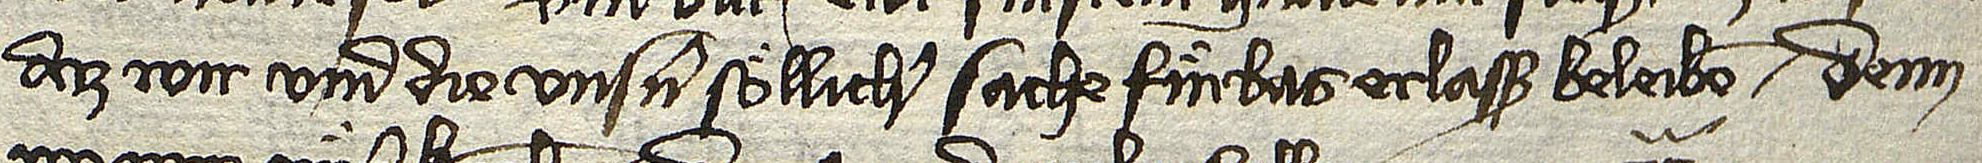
daʒ wir vnd die vnſ*n ſöllich* ſache fürbas erlaſſ* beleibe* / Denn
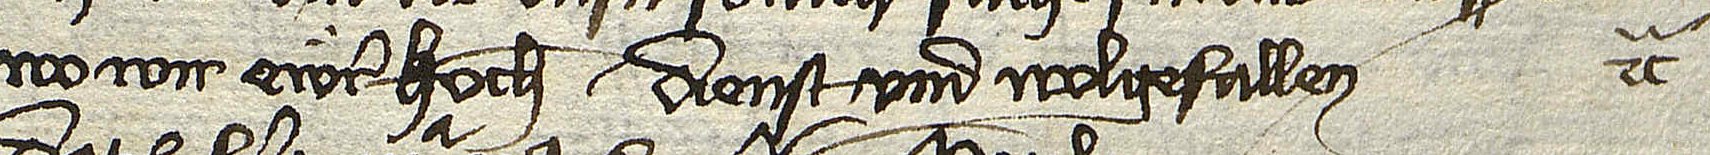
wo wir eẅr* hoch* / Dienſt vnd wolgefallen ec*
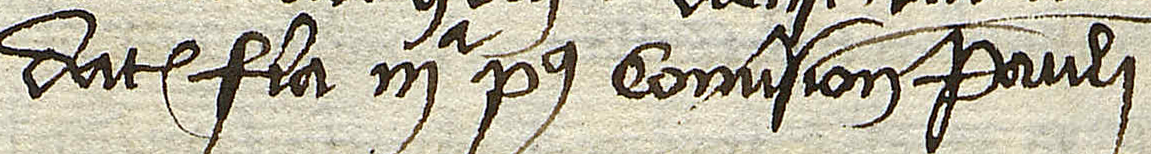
Dat* f*ia iii* p* Conu*ſion* Pauli
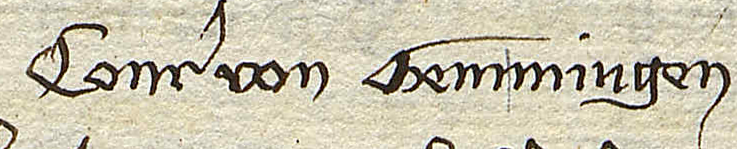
Conr* von Gemmingen
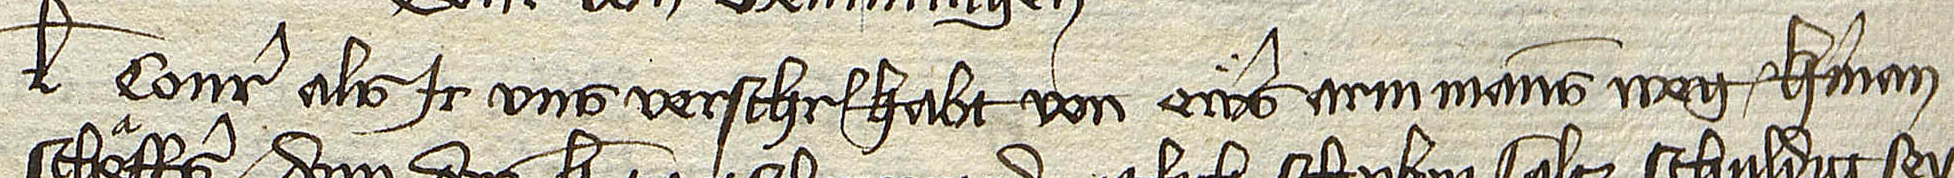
L* Conr* als Ir vns verſchr* habt von eẅ*s arm mans* weg* h*man
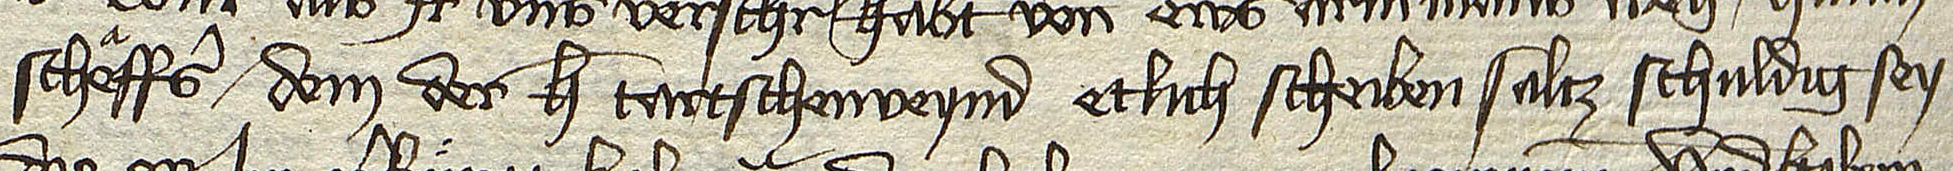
ſchëffs* / dem der* h* tartſchenveynd etlich ſchriben ſalcʒ ſchuldig ſey
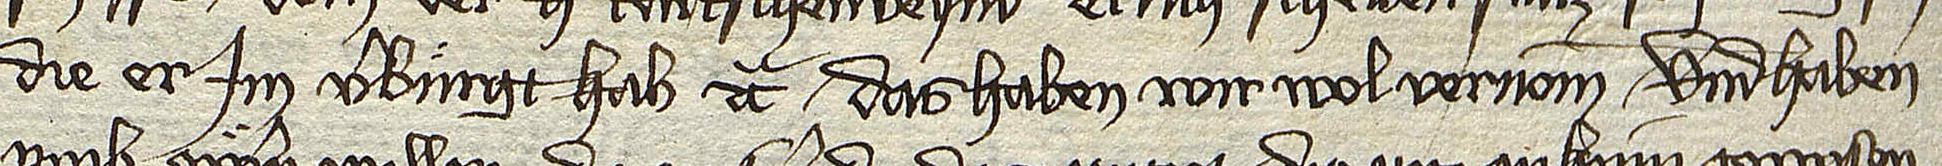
die er Im v*bürgt hab ec* / Das haben wir wol vernom* / Vnd haben
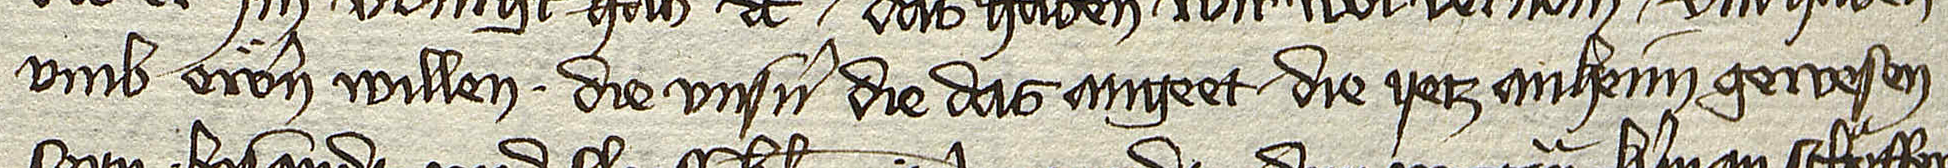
vmb eẅ*n willen . die vnſ*n die das angeet / die yecʒ anheim geweſen
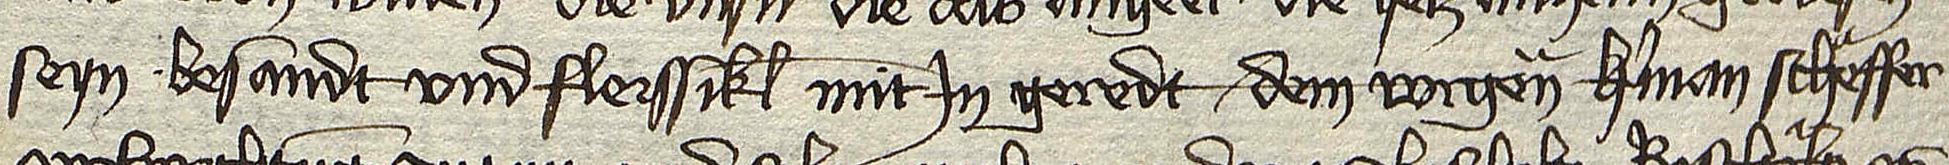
ſeyn . beſandt vnd fleiſſikl* mit In geredt / dem vorgen* h*man ſchëffer
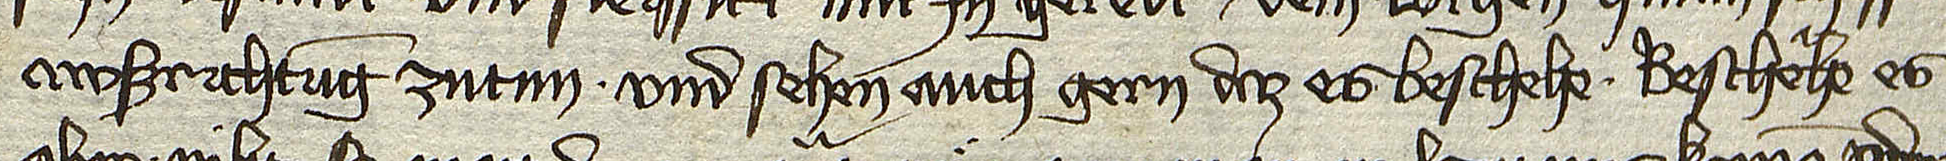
awſʒrichtu*g ʒutun . vnd ſehen daʒ es beſchehe * Beſchëhe es
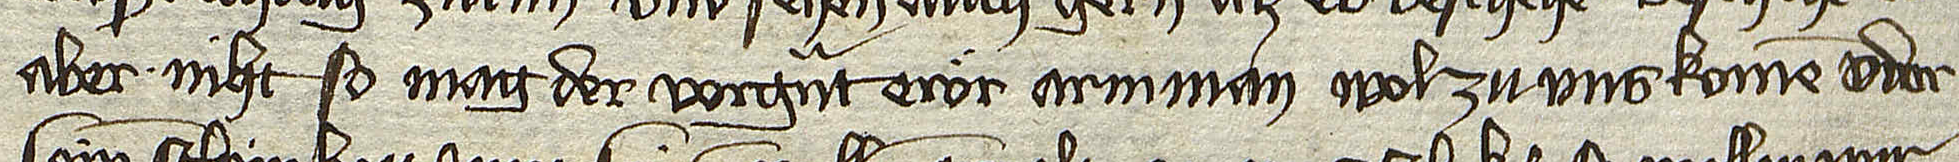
aber . niht ſo mag der vorg*nt eẅr armman wol ʒu vns kome* oder
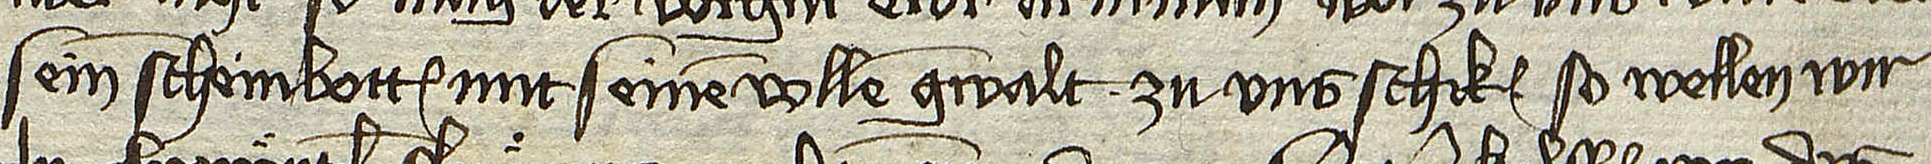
ſein* ſcheinbott* mit ſeine* volle* gwalt . ʒu vns ſchik* ſo wellen wir
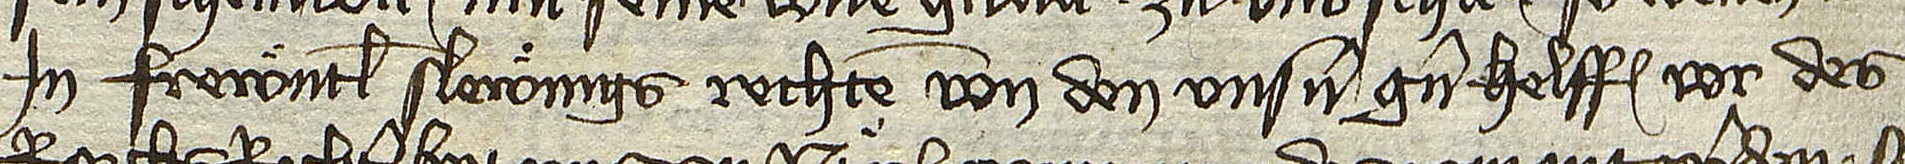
In freẅntl* ſlewnigs rechte* von den vnſ*n g*n helff* vor des
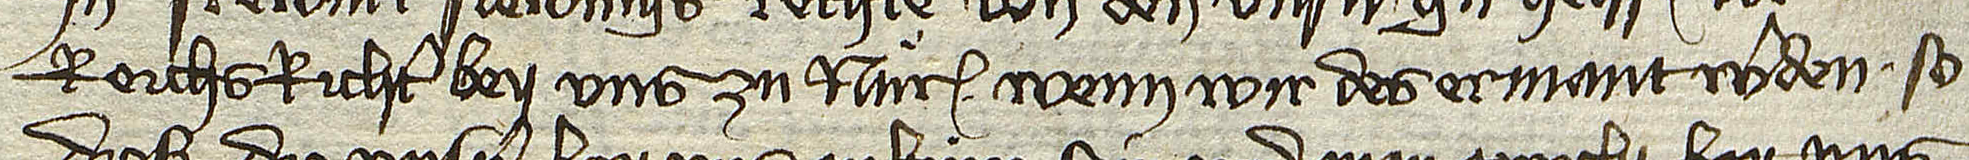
Reichs Richt* bey vns ʒu Nür* wenn wir des ermant w*den . ſo
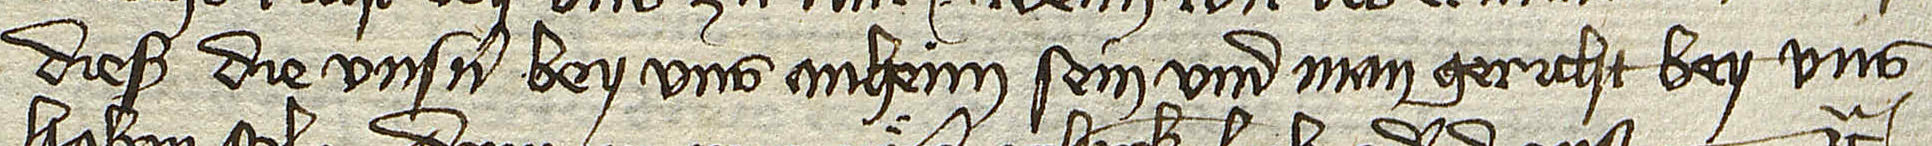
dieſ* die vnſ*n bey vns anheim ſein vnd man gericht bey vns
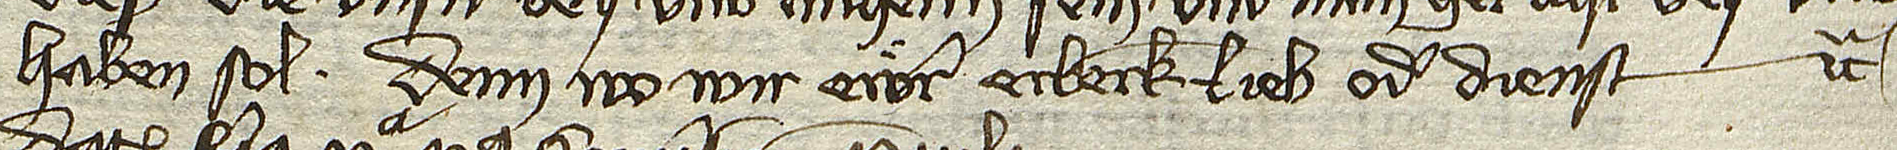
haben ſol . Denn wo wir eẅr* erberk* lieb od* dienſt ec*
